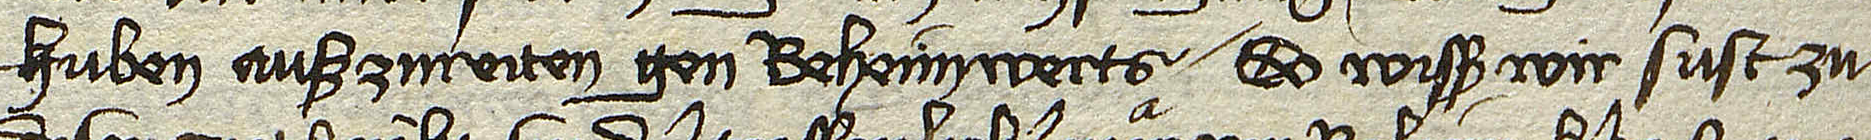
huben auſʒ ʒureiten gen Beheimwerts / So wiſſ* wir ſuſt ʒu
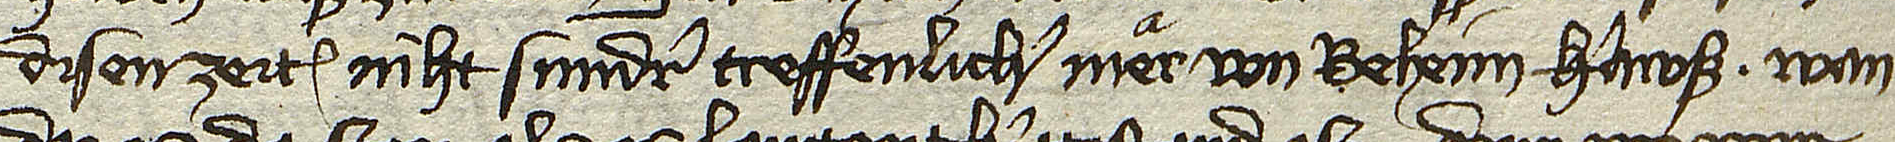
diſen ʒeit* niht ſundr* treffenlich* mër von Beheim he*awſʒ . wan
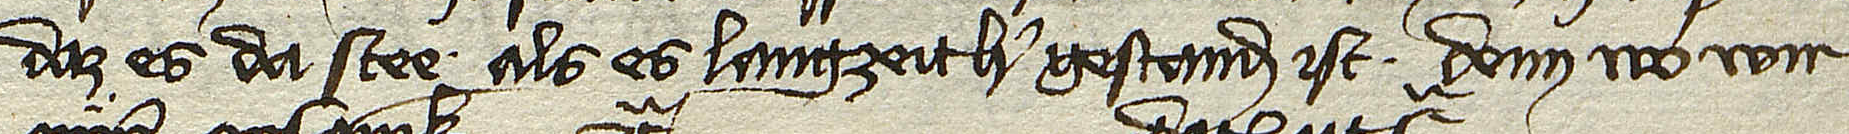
daʒ es da ſtee . als es langʒeith* geſtand* iſt . denn wo wir
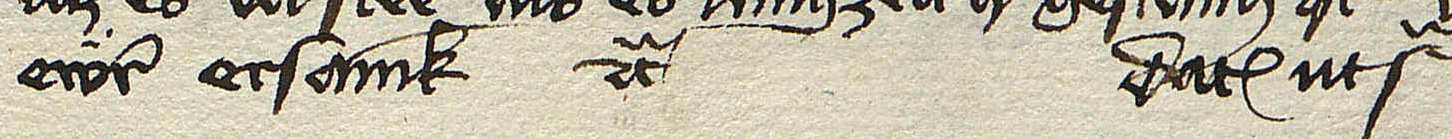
ewr erſa*mk ec* dat ut ſ*
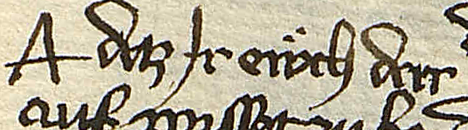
daʒ Ir ewch dar
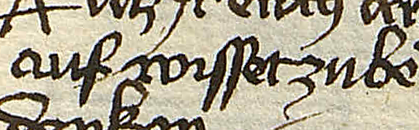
auf wiſſet ʒu be
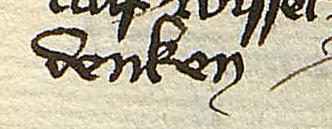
denken /
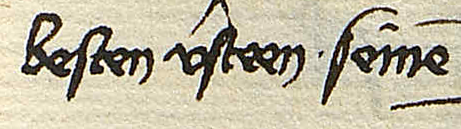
beſten v*ſteen . ſeine*
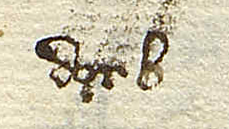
der b
